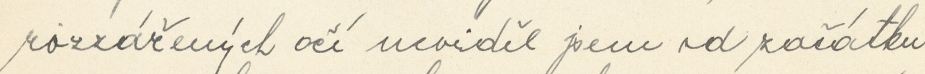rozzářených očí neviděl jsem od začátku
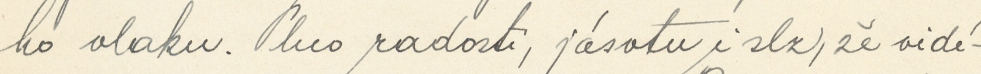ho vlaku. Plno radosti, jásotu i slz, že vidí-
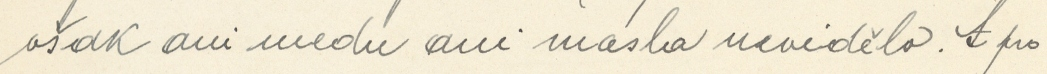však ani medu ani másla nevidělo. A pro
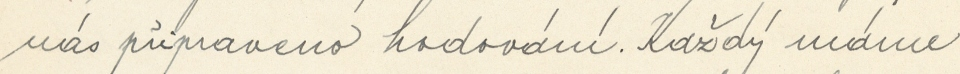nás připraveno hodování. Každý máme
